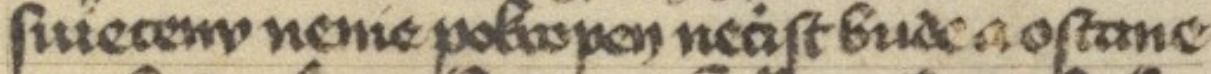ſuieceny nenie pokropen neċiſt bude a oſtane
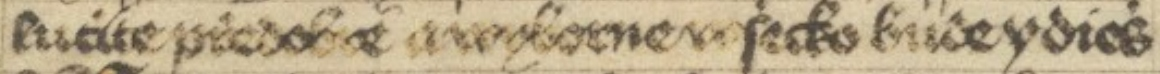luċíte pṙedobre a wyborne wẛecko bude ydieṡ
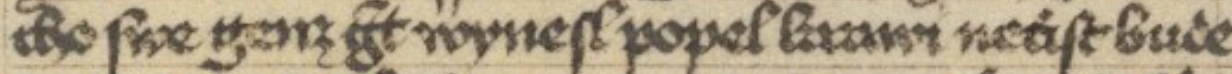cho ſwe genz g̑t wyneſl popel krawi neċiſt bude
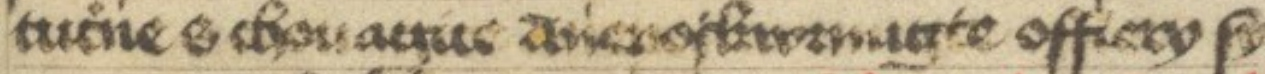tuċne s chouagice Anepoẛkwrnugte offiery ſy-
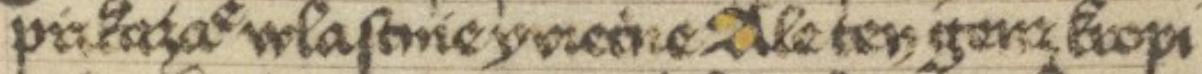pṙikazae wlaſtnie y vieċne Ale ten genz kropi
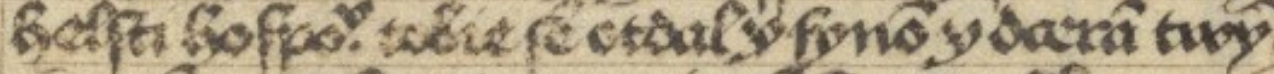helſti hoſpo.v tobie ſe otdaly ſynȏ y dcerȃ twŷ
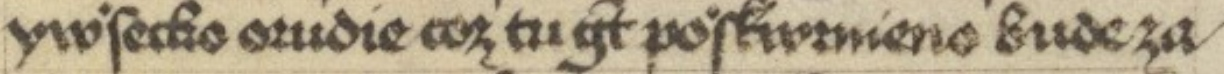ywẛecko orudie což tu g̑t poẛkwrnieno bude za-
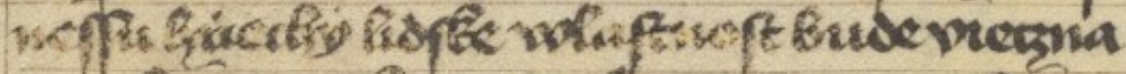neſſu hṙiechy lidſke wlaſtnoſt bude vieczna
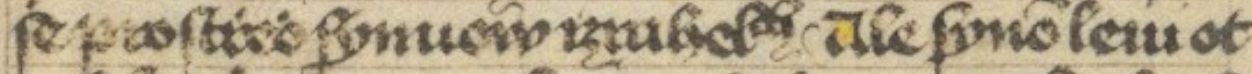ẛe proſtṙeṡ ſynuow izrahelch Ale ſynȏ leui ot-
